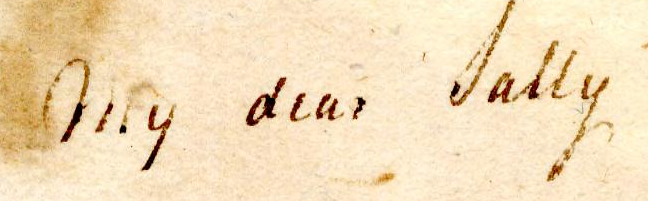My dear Sally
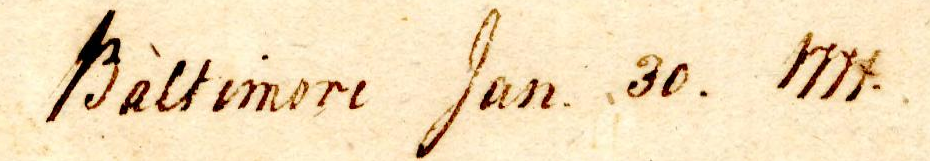Baltimore Jan. 30. 1777.
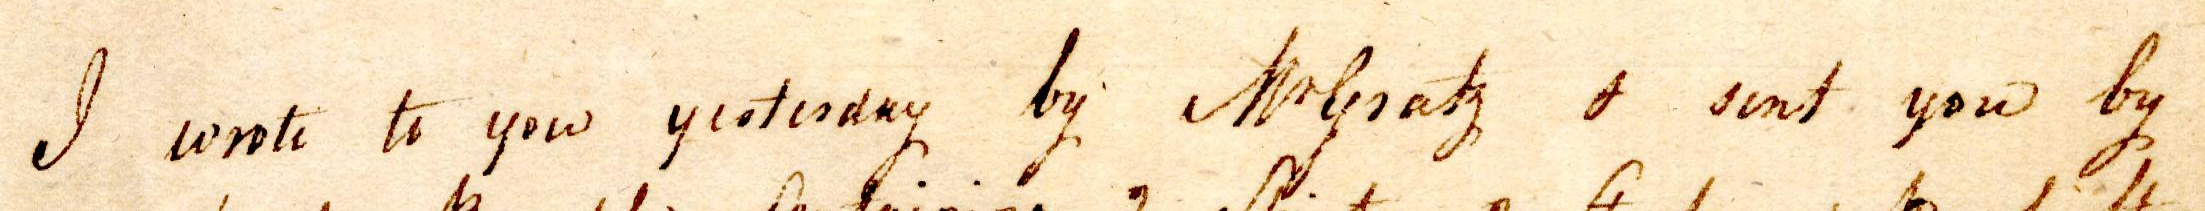I wrote to you yesterday by M^r Gratz & sent you by
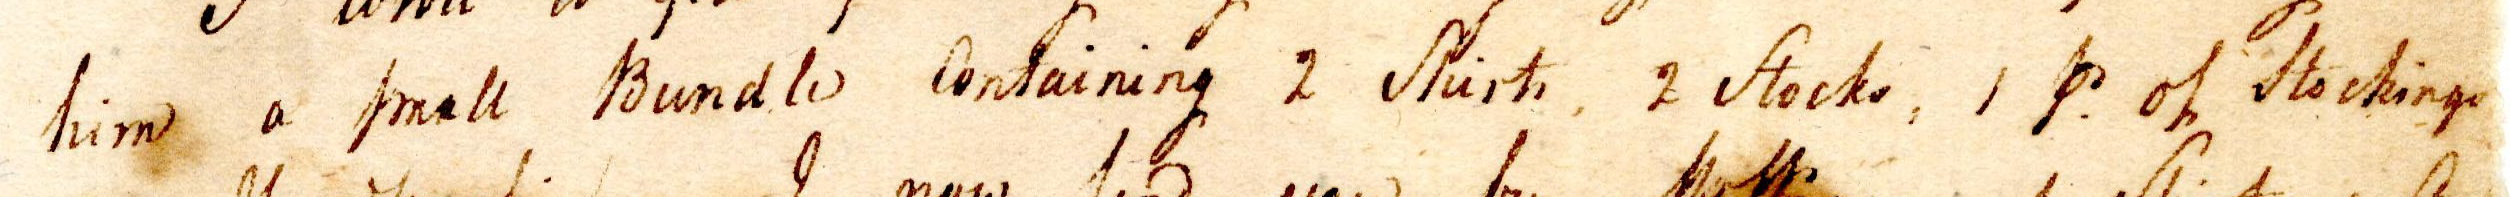him a small Bundle containing 2 Shirts, 2 Stocks, 1 p^r of Stockings
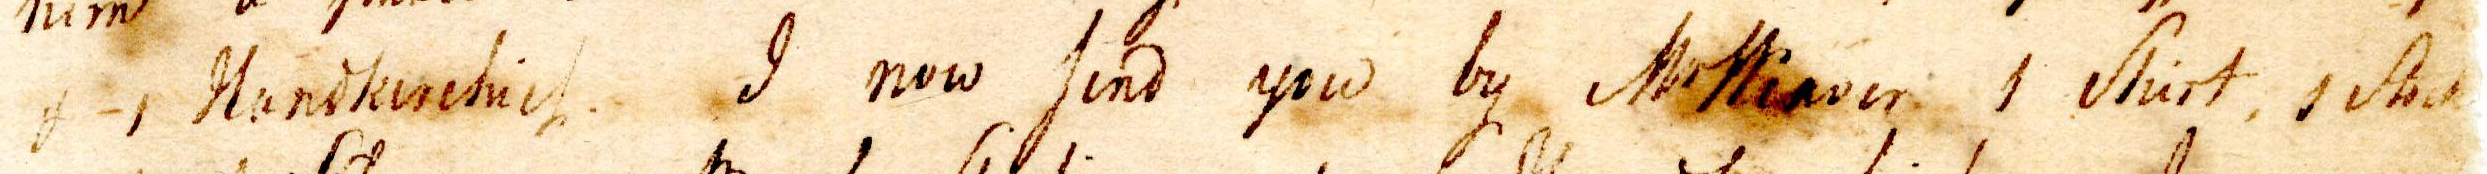& 1 Handkerchief. I now send you by M^r Weaver 1 Shirt, 1 She
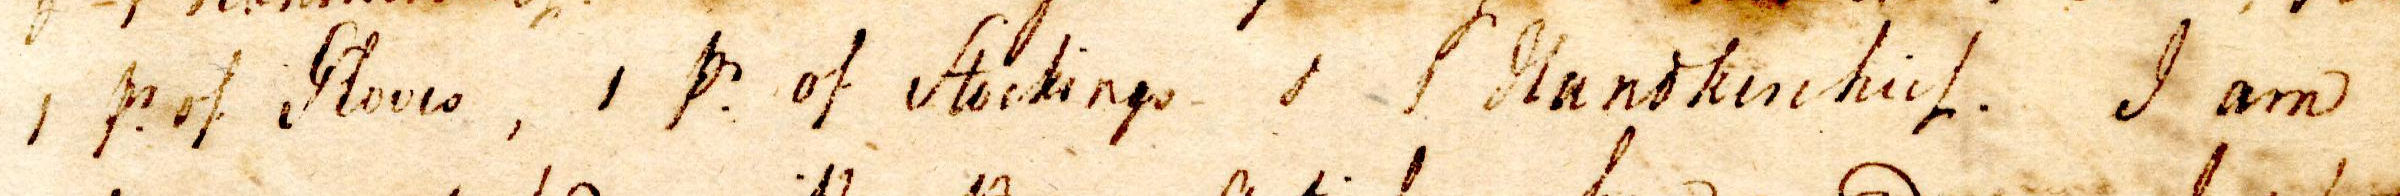1 p^r. of Gloves, 1 pr. of Stockings & 1 Handkerchief. I am
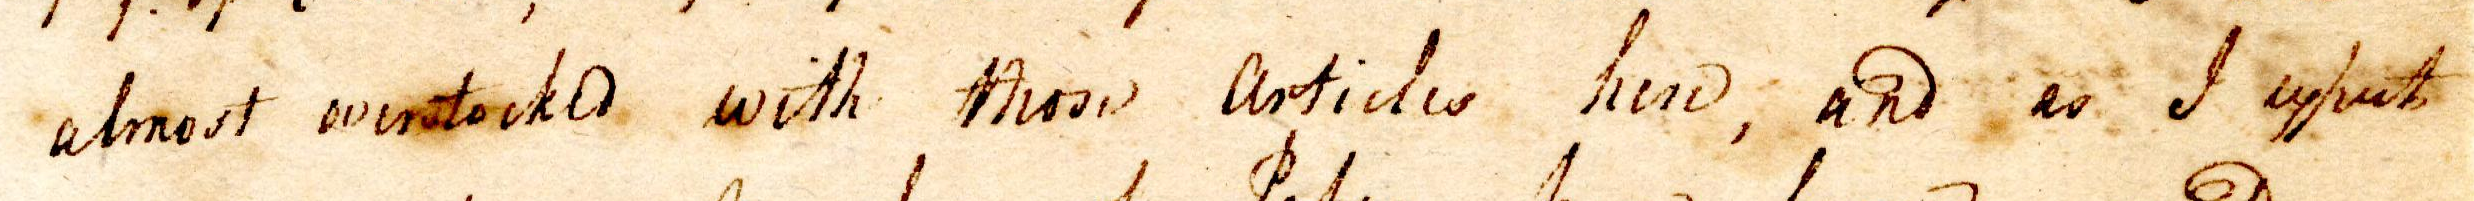almost over stocked with those Articles here, and as I expect
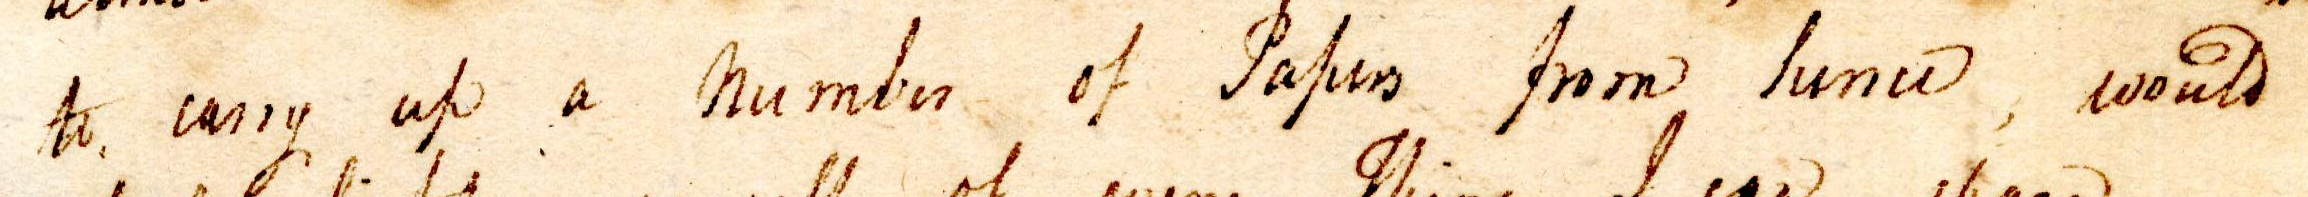to carry up a Number of Papers from hence, would
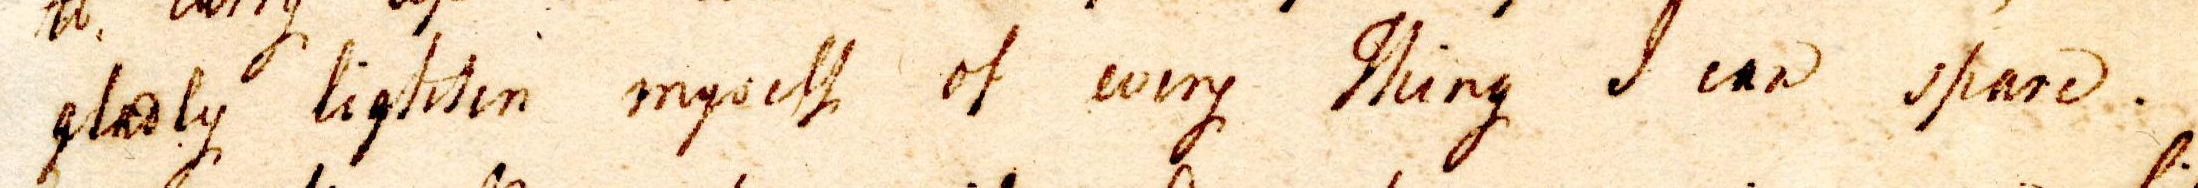gladly lighten myself of every Thing I can spare.
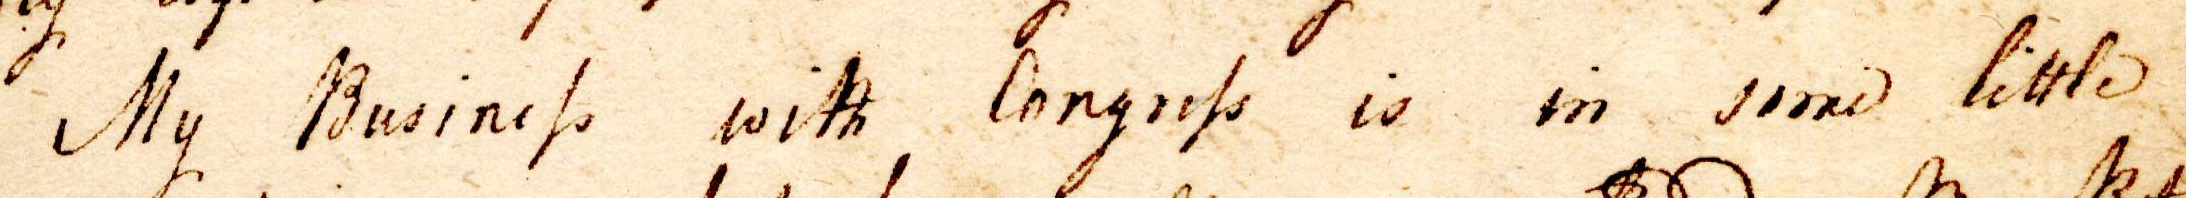My Business with Congress is in some little
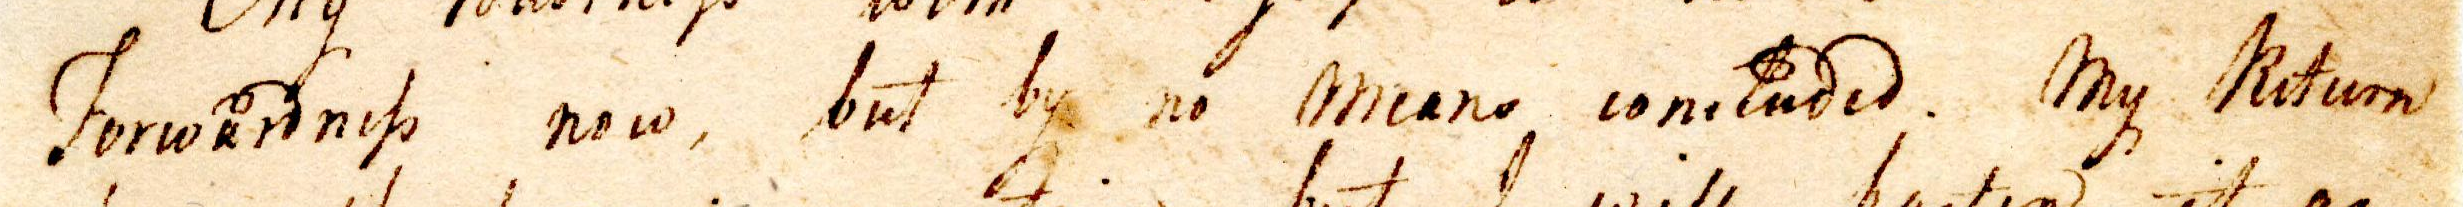Forwardness now, but by no Means concluded. My Return
